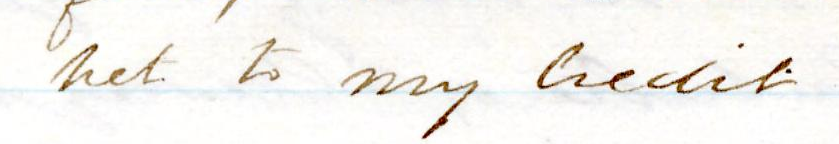net to my credit
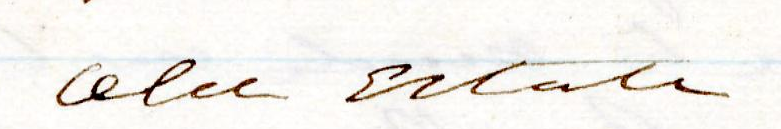Celee Estate
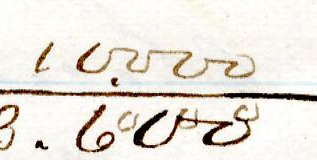10.000
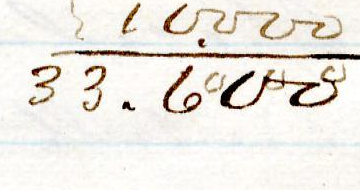33.600
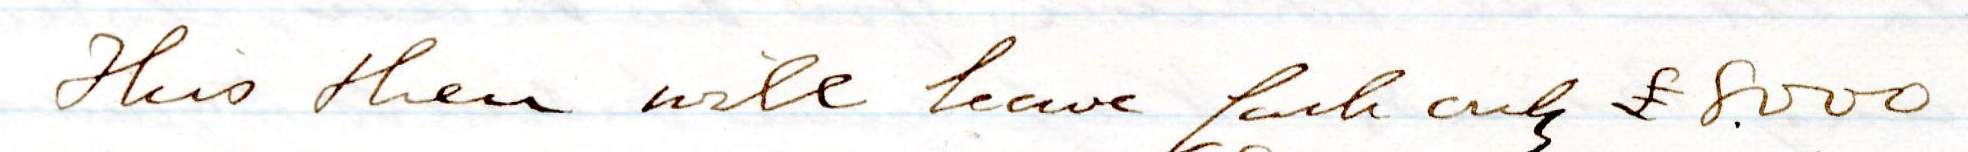This then will leave cash only £8.000
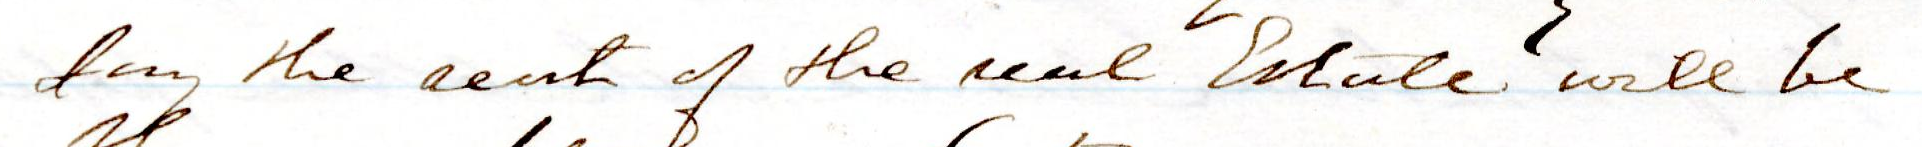say the acct of the real Estate will be
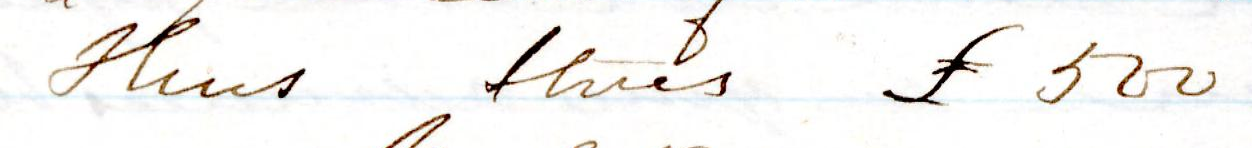Thus this £500
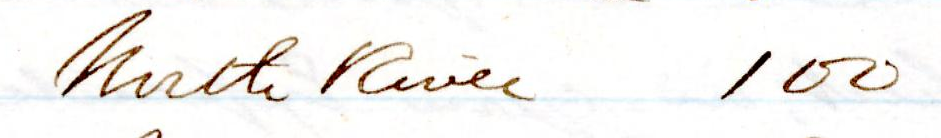Merth revee 100
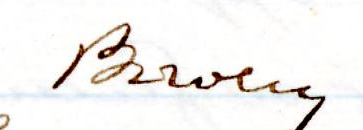Brewery
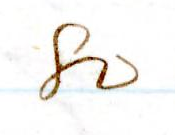80
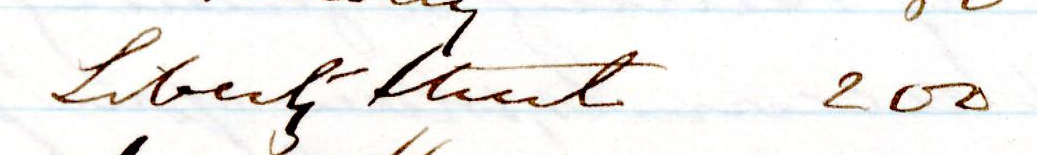Liberty street 200
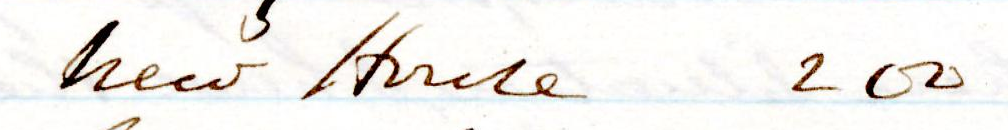new horse 200
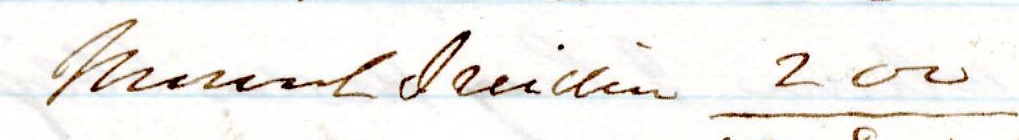Market decision 200
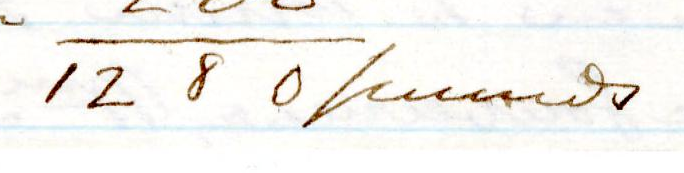1280 Pounds
